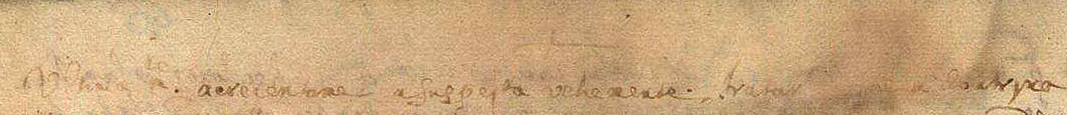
Vltimamte. acresentam a suspeita vehemente tratar _ doutrjna
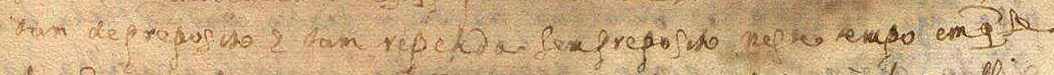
tam de preposito E tam repetida sem preposito neste tempo em q̄ se
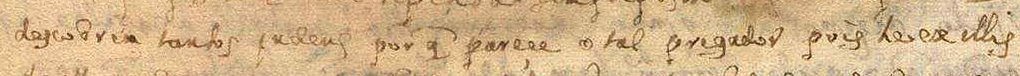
descobrem tantos judeus porq̄ parece o tal pregador pois he ex illis
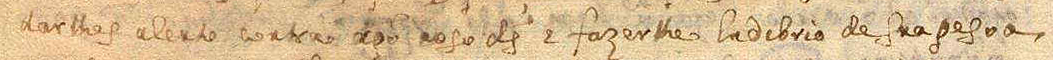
darlhes alento contra xpō noso ds̄ E fazerlhe ludibrio de sua pesoa
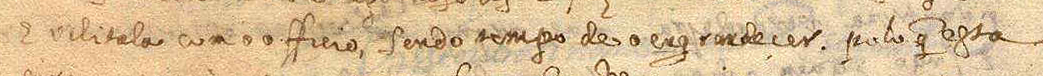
Evilitala com o officio, sendo tempo de o engrandecer polo q̄ esta
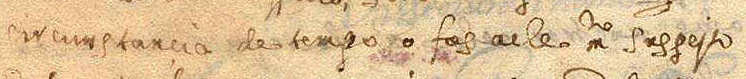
circunstancia de tempo o faz a ele mto suspejto
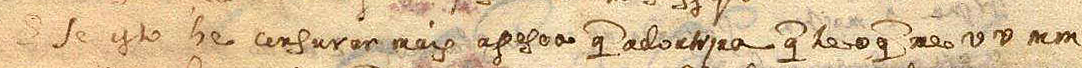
E se isto he censurar mais a pesoa q̄ a doutrjna q̄ he o q̄ me vv mm
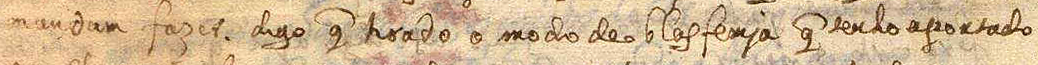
mandam fazer digo q̄ tirado o modo de blasfemja q̄ sendo aportado
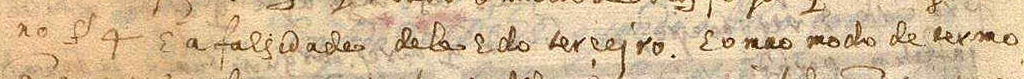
no §4 E a falsidade dele E do tercejro E o mao modo de termo
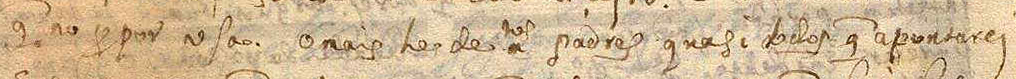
q̄ no ꝓpor vsa o mais he de mtos padres quasi todos q̄ apontarej
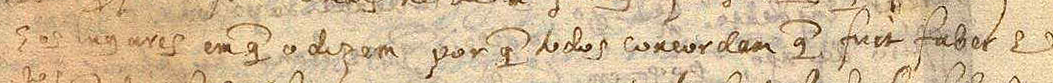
E os lugares em q̄ o dizem porq̄ todos concordam q̄ fuit faber E
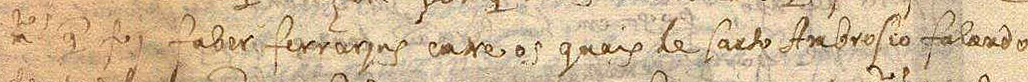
mtos q̄ foj faber ferrarjus entre os quais de santo Ambrosio falando
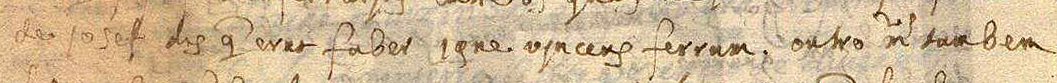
de josef dis q̄ erat faber igne vjncens ferram. outro mtos tambem
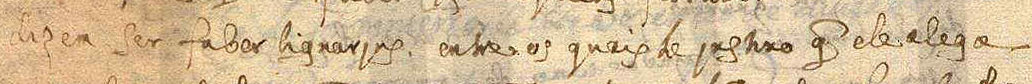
dizer ser faber lignarius entre os quais de justino q̄ ele alega
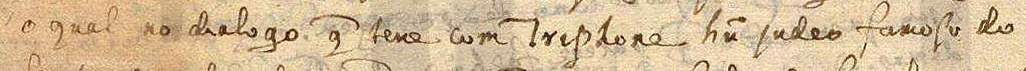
o qual no dialogo q̄ teue com Triptone hū judeo famoso do
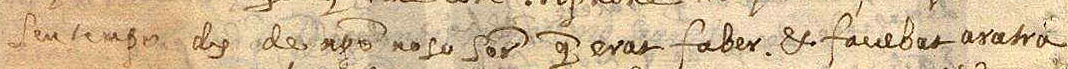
seu tempo dis de xp̄o noso sōr q̄ erat faber & facebat aratra
